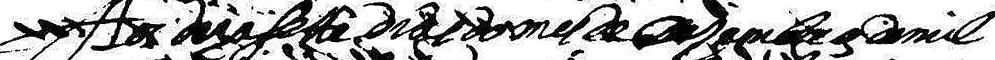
Aos dezasette dias do mes de Dezembro de mil
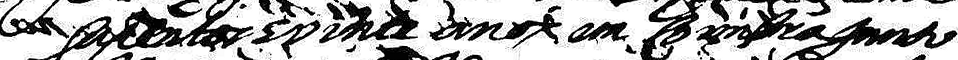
seiscentos e vinte anos em Coimbra junto
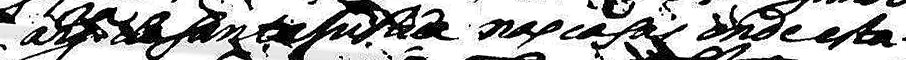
a ig.ra de Santa Justa nas casas onde esta
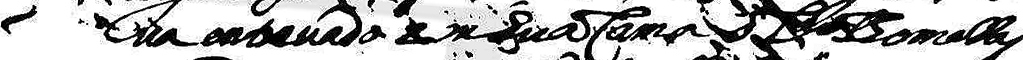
ua entreuado em huā Cama o L.do Thome Vas
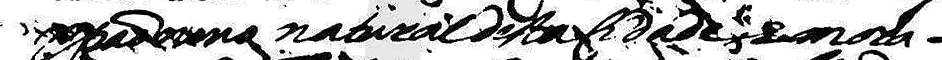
Xpaõ nouo, natural desta Cidade, e mora
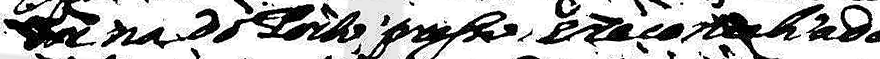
dor na do Porto, presso, e reco__iliado
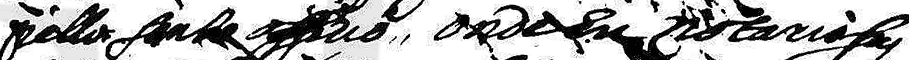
pello santo officio, onde eu notario fuj
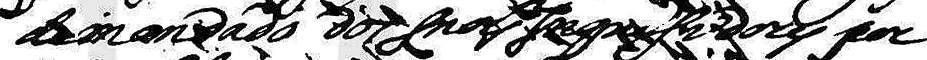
de mandado dos Sn.ors Inquisidores por
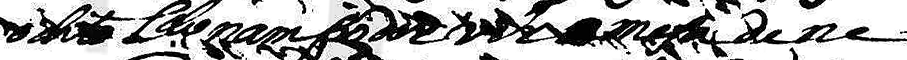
o dito L.do nam poder vir a mesa de ne
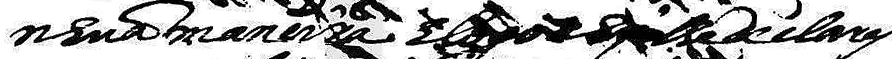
nhuā maneira e logo __ lhe declarej
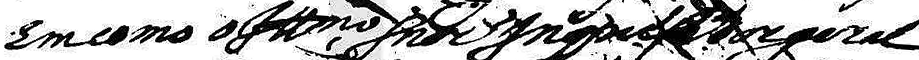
em como o Ill.mo Snor Jnquisidor geral
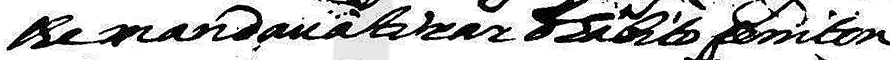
lhe mandaua tirar o habito peniten
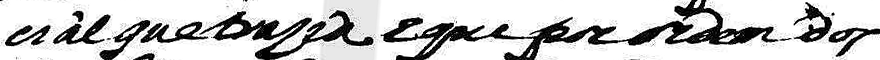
cial que trazia e que por ordem dos
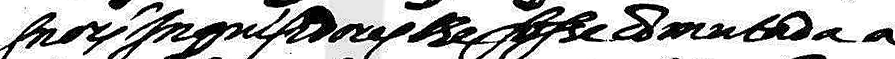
Snors Inquisidores lhe fosse cōmutada a
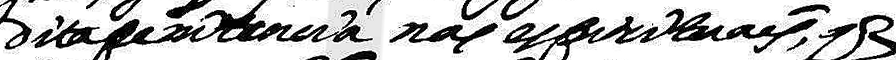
dita penitencīa nas espirituaes, q̄
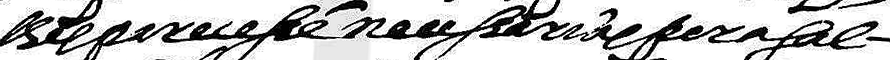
lhes parecessē necessarias pera sal
